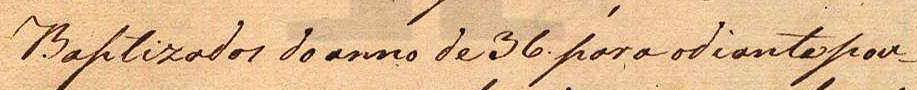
Baptizados do anno de 36. para o diante pou
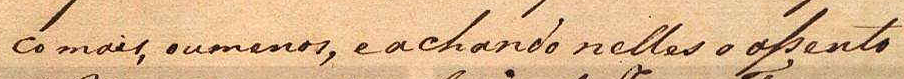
co mais, ou menos, e achando nelles o assento
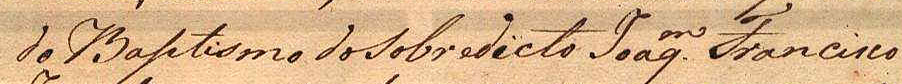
do Baptismo do sobredicto Ioaq.m Francisco
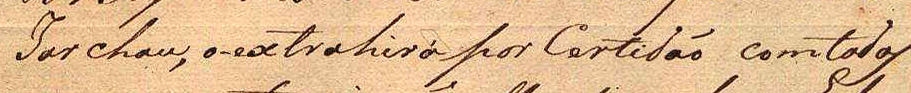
Iarchau, o extrahira por Certidaõ com todas
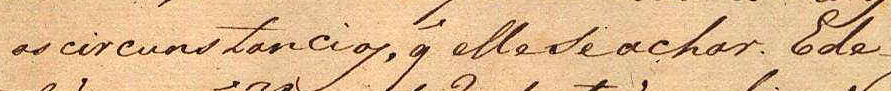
as circunstancias, q̄ elle se achar. E de
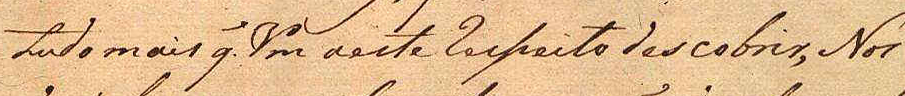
tudo mais q̄ Vm a este Respeito descobrir, Nos
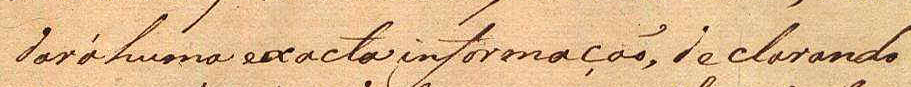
dará huma exacta informaçaõ, declarando
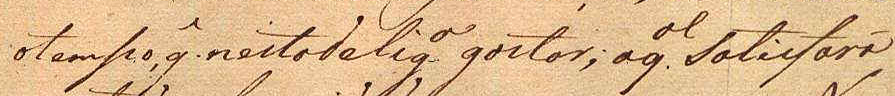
o tempo, q̄ nesta delig.a gastar; a q̄.al satisfará
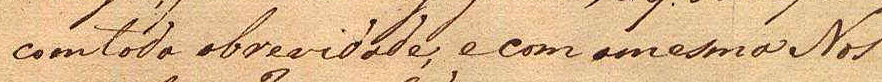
com toda o brevidade, e com a mesma Nos
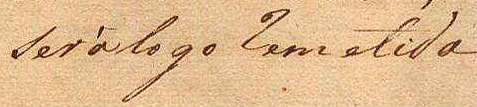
será logo Remetida
